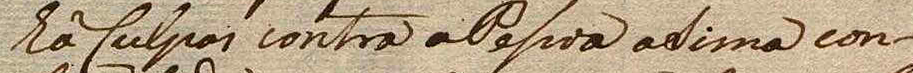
ha Culpas contra a Pessoa asima con
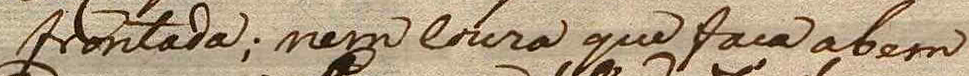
frontada; nem couza que faça a bem
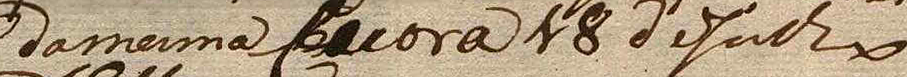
da mesma. Euora 18 de Julho
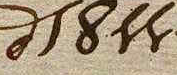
d̄ 1811
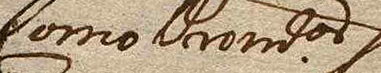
Como Promt.or
